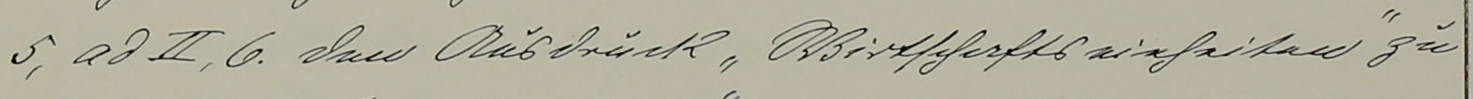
5. ad II,6. den Ausdruck „Wirtschaftseinheiten“ zu
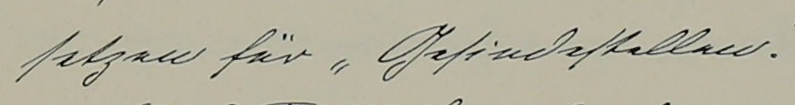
setzen für „Gesindestellen“.
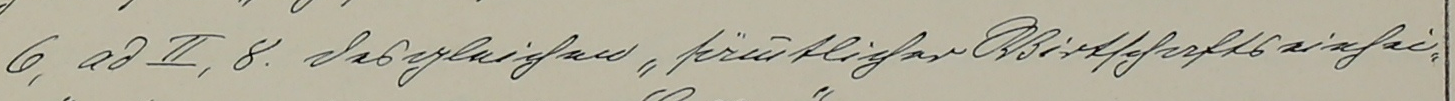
6. ad II,8. desgleichen „sämtlicher Wirtschaftseinhei-
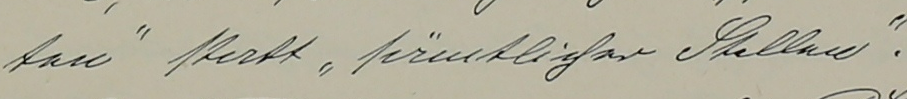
ten“ statt „sämtlicher Stellen“.
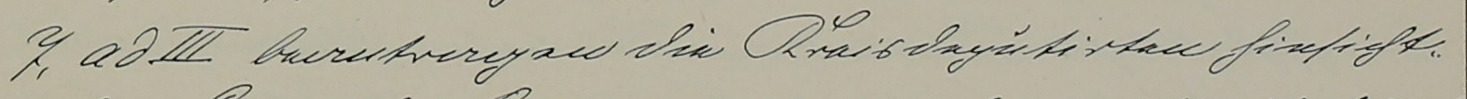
7. ad III beantragen die Kreisdeputirten hinsicht-
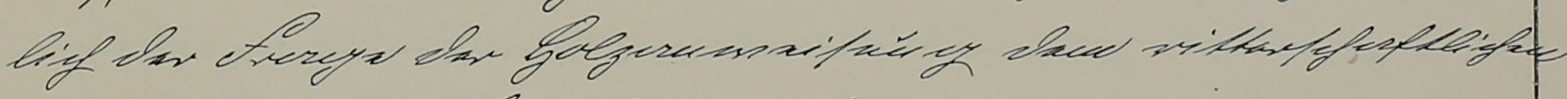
lich der Frage der Holzanweisung dem ritterschaftlichen
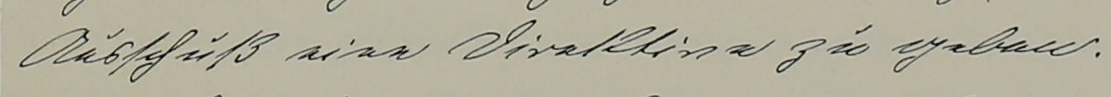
Ausschuß eine Direktive zu geben.
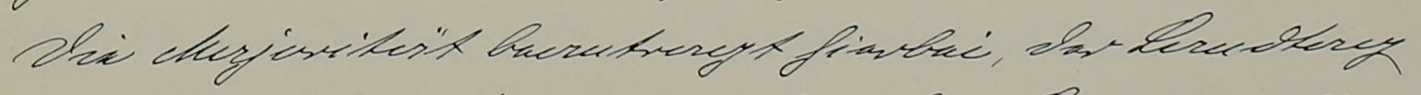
Die Majorität beantragt hierbei, der Landtag
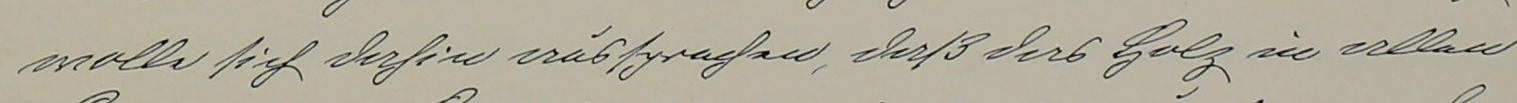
wolle sich dahin aussprechen, daß das Holz in allen
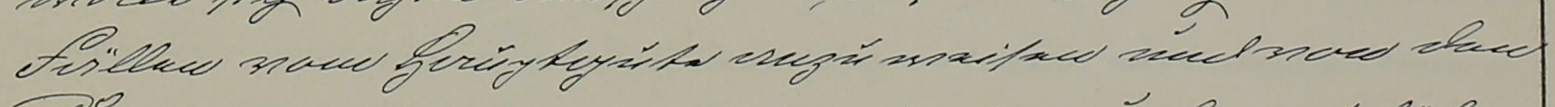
Fällen vom Hauptgute anzuweisen und von den
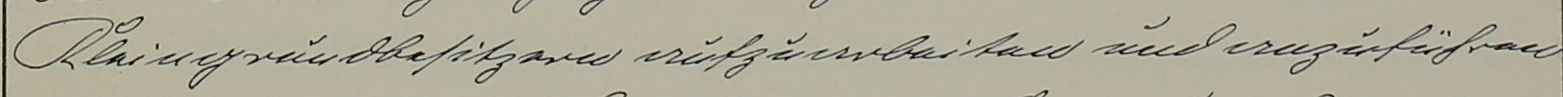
Kleingrundbesitzern aufzuarbeiten und anzuführen
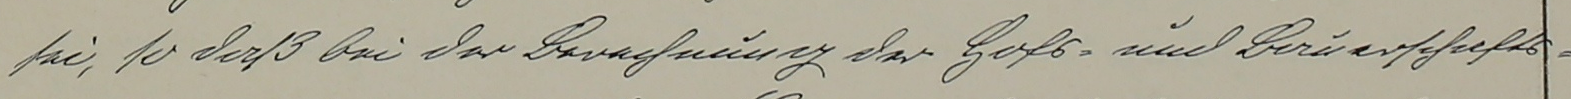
sei, so daß bei der Berechnung der Hofs- und Bauerschafts-
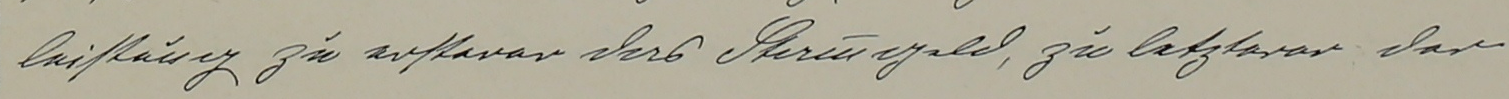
leistung zu ersterer das Stammgeld, zu letzterer der
